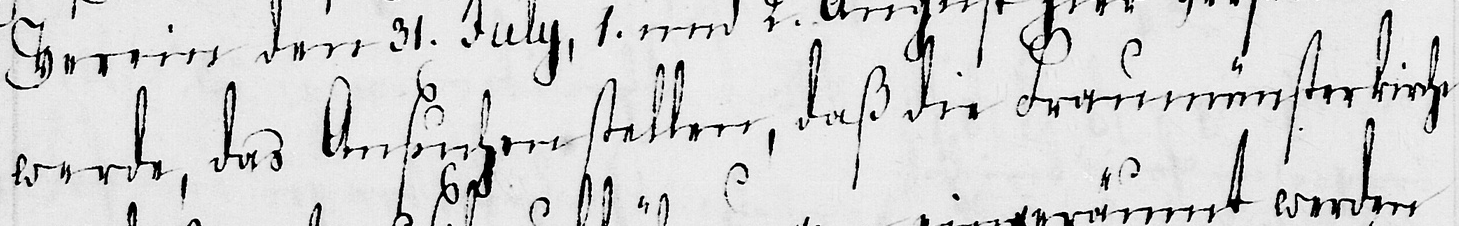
werde, das Ansuchen stellen, daß die Fraumünsterkirc¬
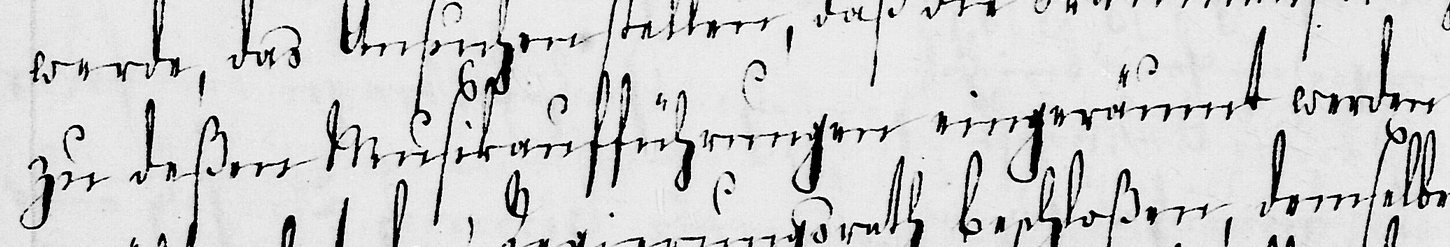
zu deßen Musikaufführungen eingeräumt werden
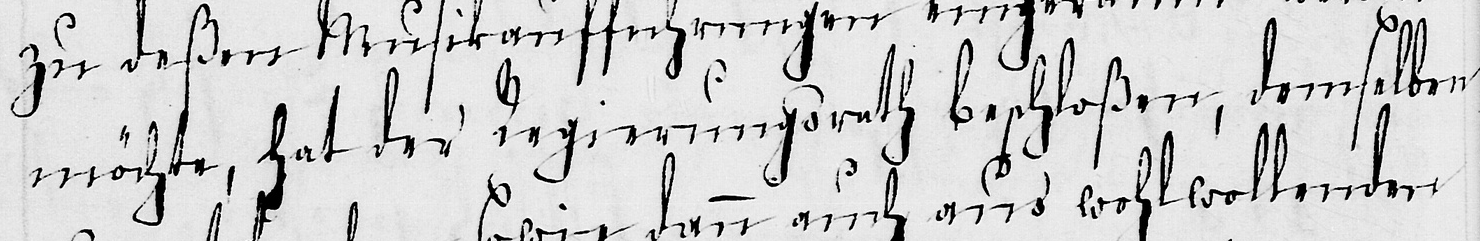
möchte, hat der Regierungsrath beschloßen, demselben
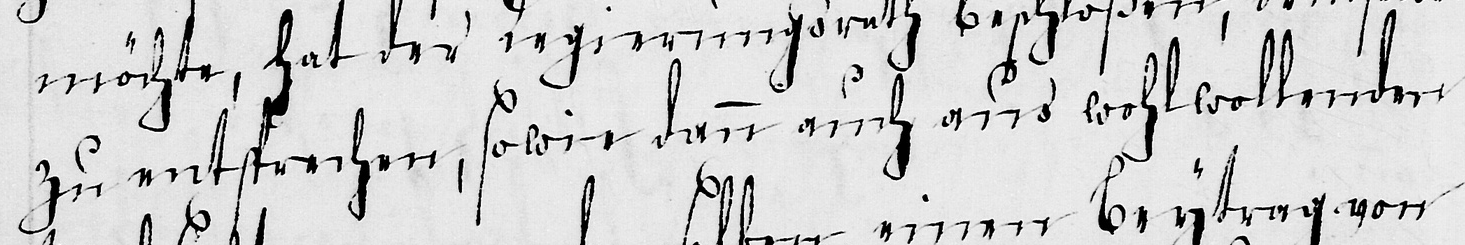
zu entsprechen, sowie dann auch aus wohlwollenden
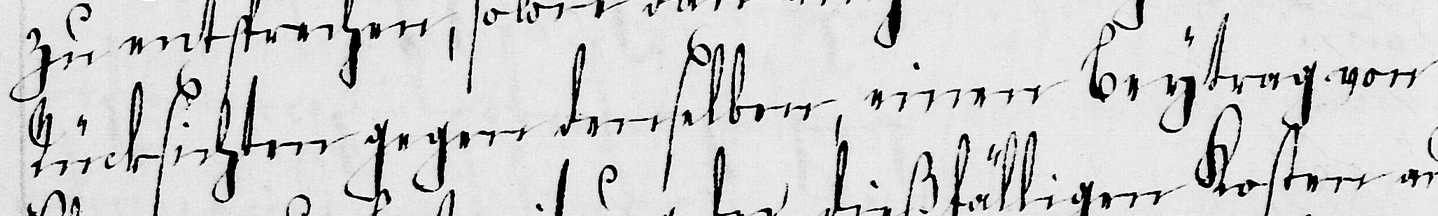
Rücksichten gegen denselben, einen Beytrag von
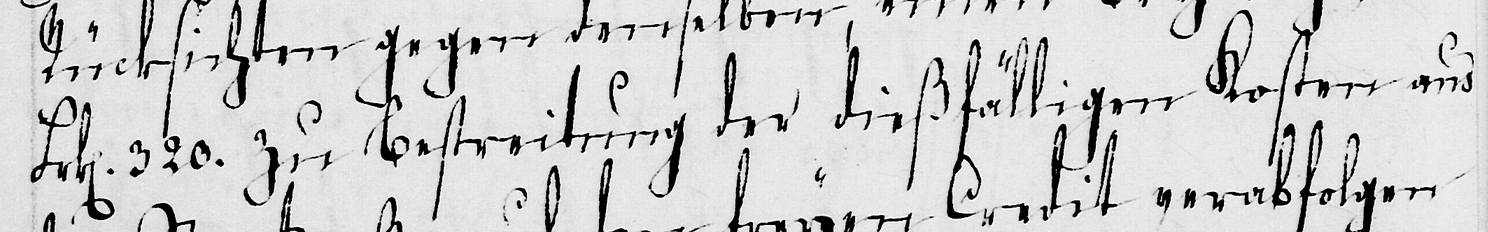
Frk. 320. zu Bestreitung der dießfälligen Kosten aus
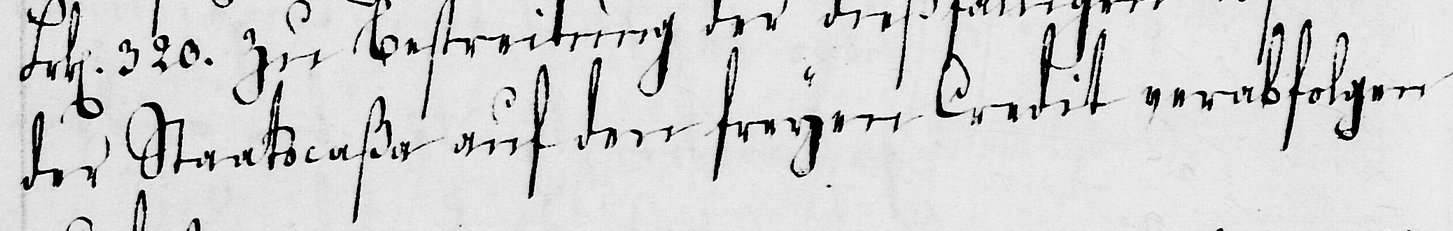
der Staatscaßa auf den freyen Credit verabfolgen
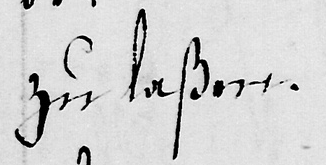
zu laßen.
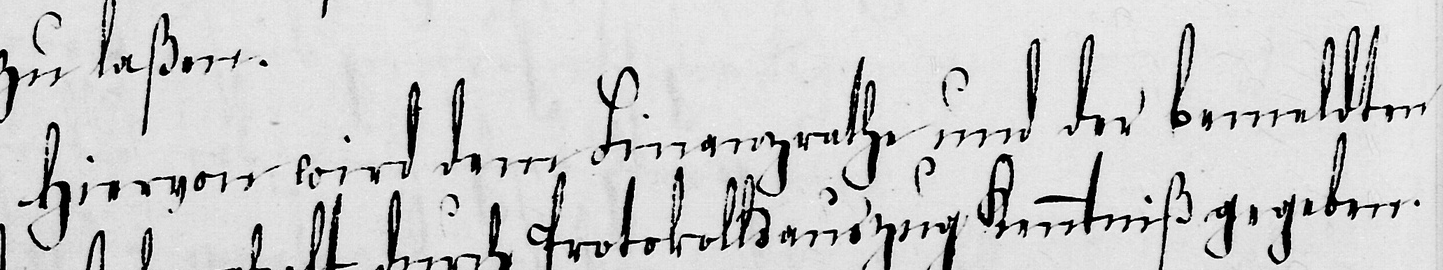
Hiervon wird dem Finanzrathe und der bemeldten
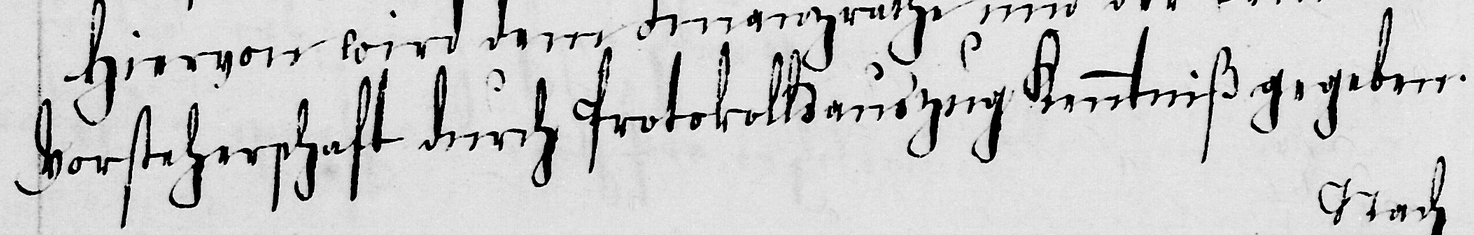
Vorsteherschaft durch Protokollsauszug Kenntniß gegeben.
